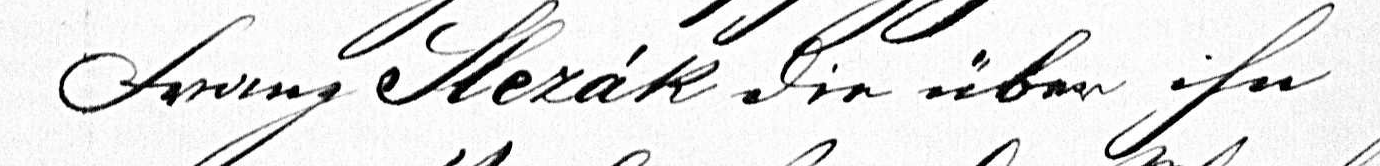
Franz Slezák die über ihn
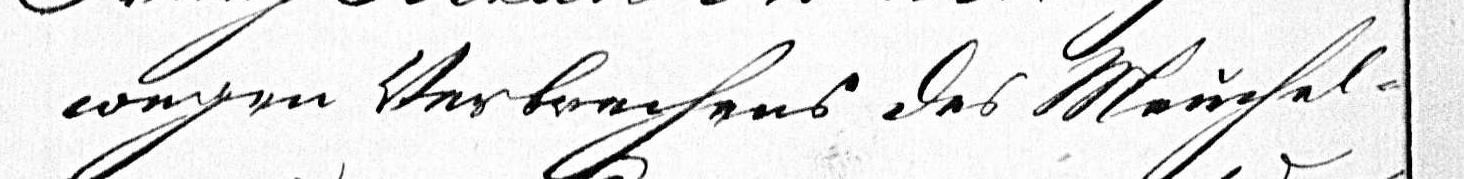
wegen Verbrechens des Meuchel¬
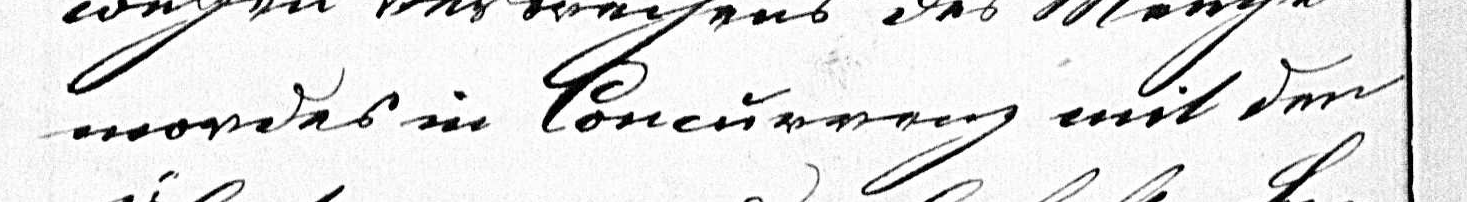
mordes in Concurrenz mit den
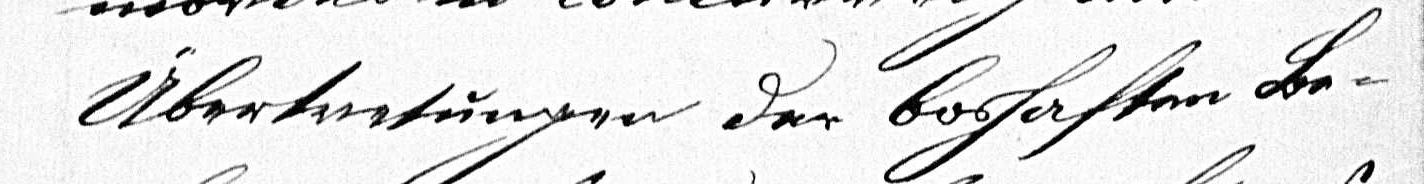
Übertretungen der boshaften Be¬
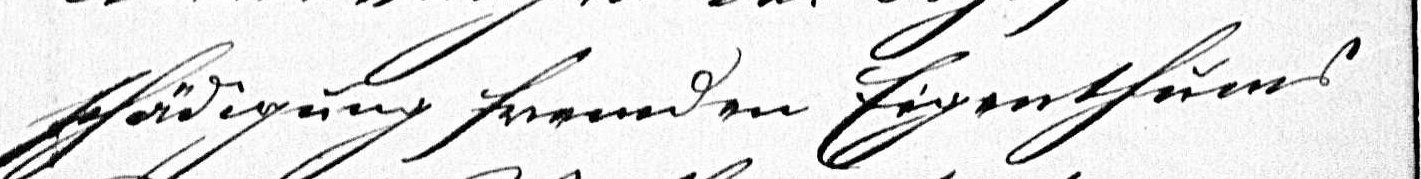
schädigung fremden Eigenthums
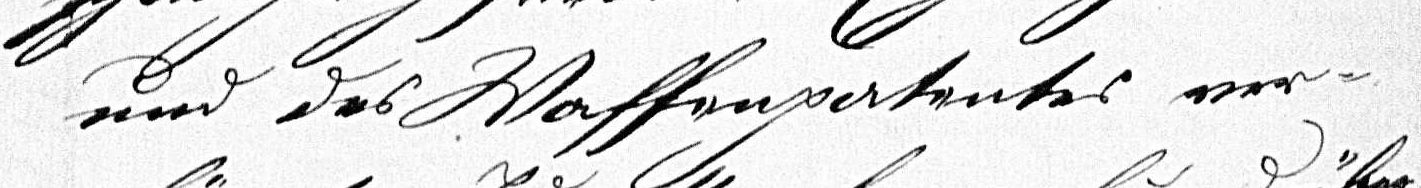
und des Waffenpatentes ver¬
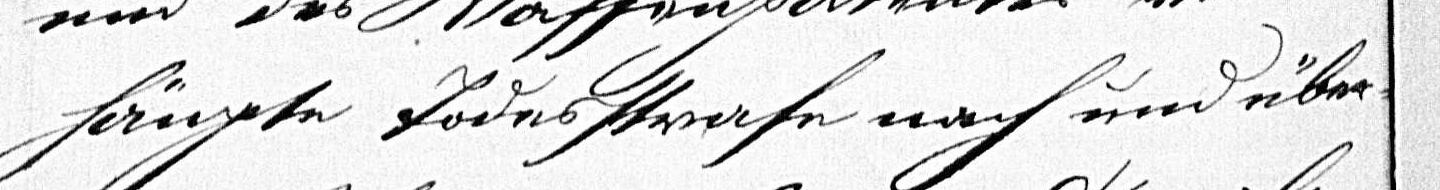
hängte Todesstrafe nach und über¬
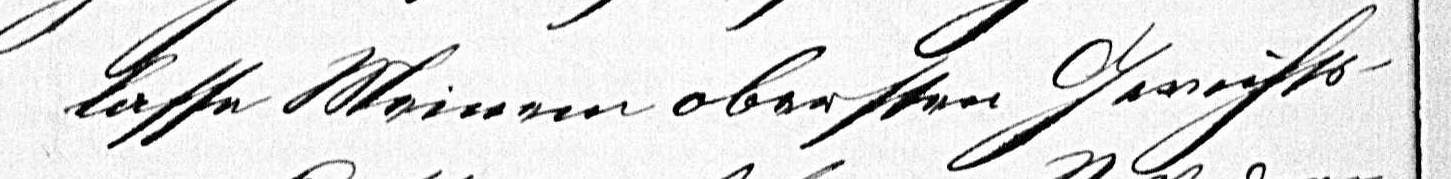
lasse Meinem obersten Gerichts-
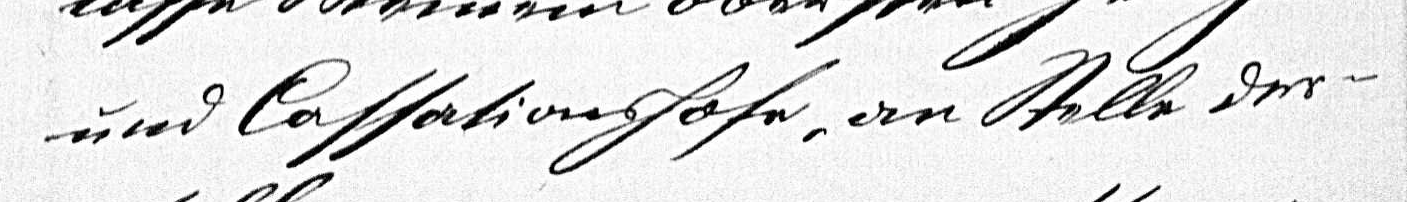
und Cassationshofe, an Stelle der¬
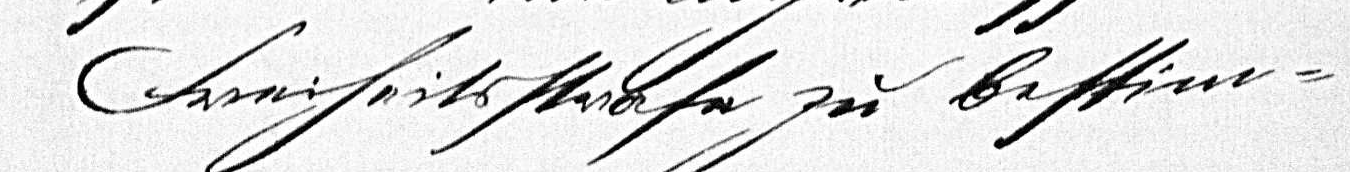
Freiheitsstrafe zu bestimm¬
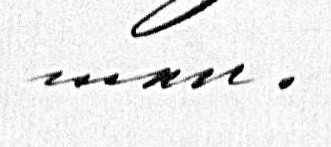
men.
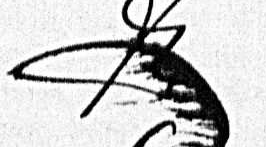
xx
